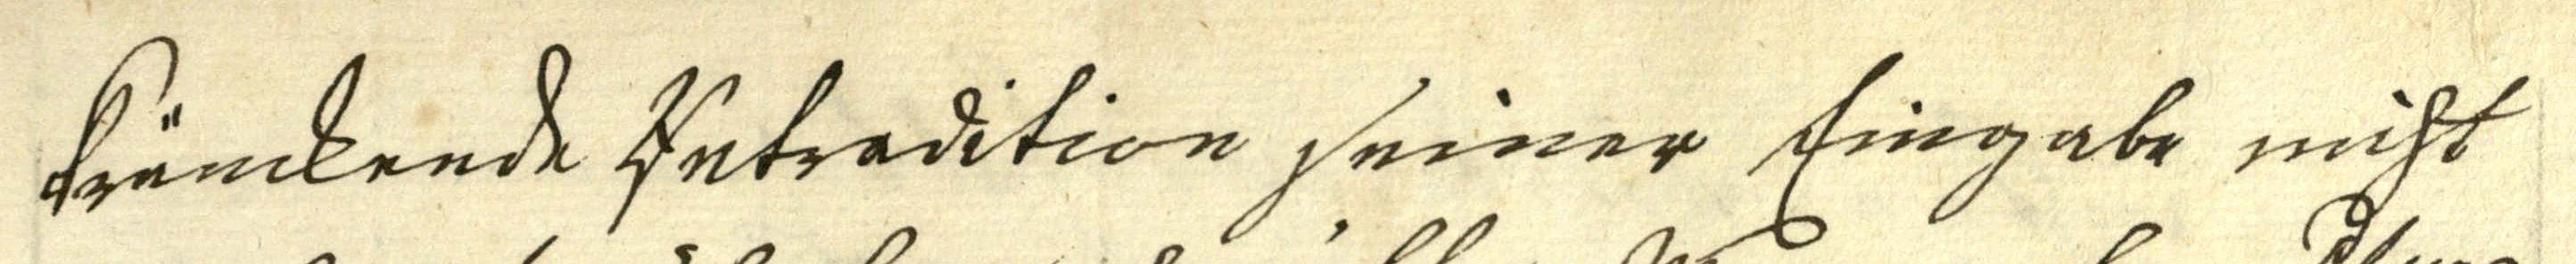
kränkende Retradition seiner Eingabe nicht
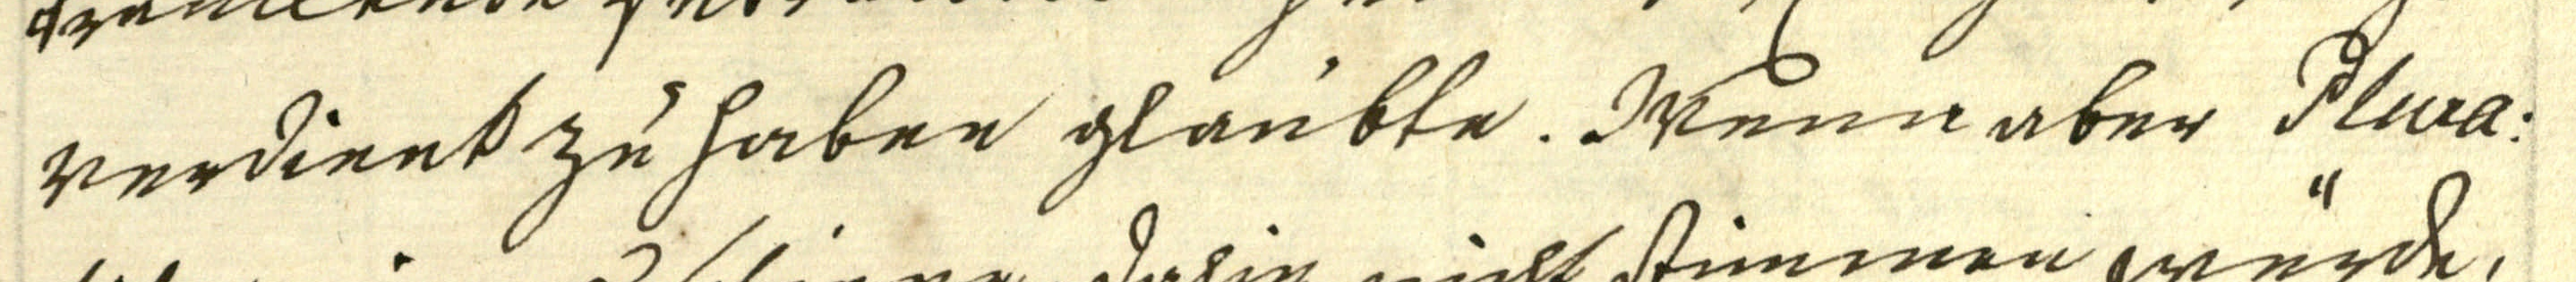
verdient zu haben glaubte. Wenn aber Plura¬
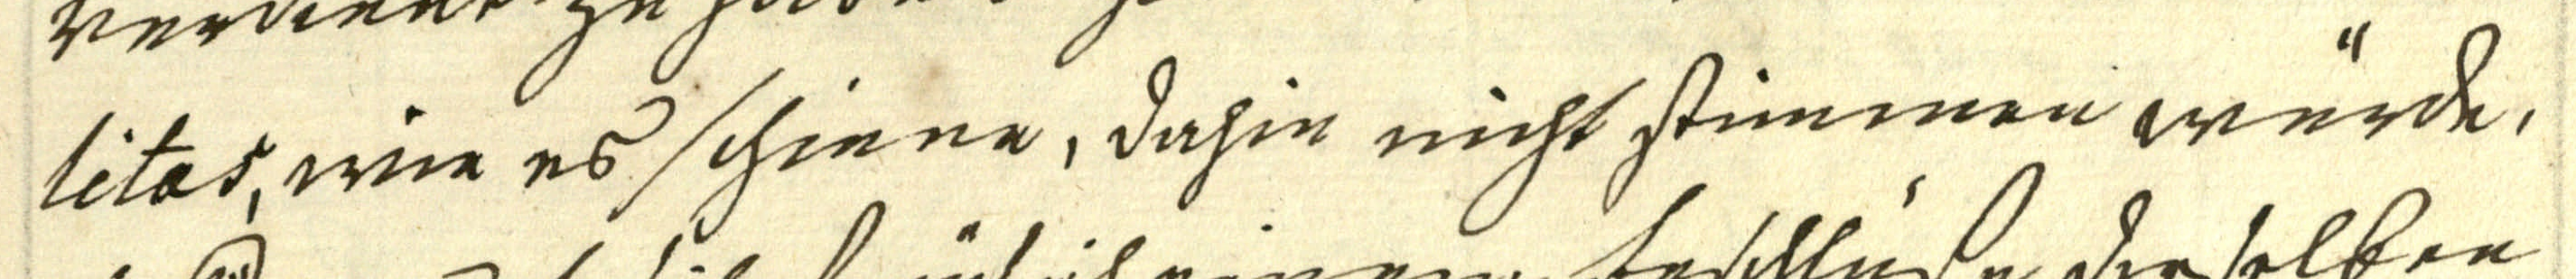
litas, wie es schiene, dahin nicht stimmen würde,
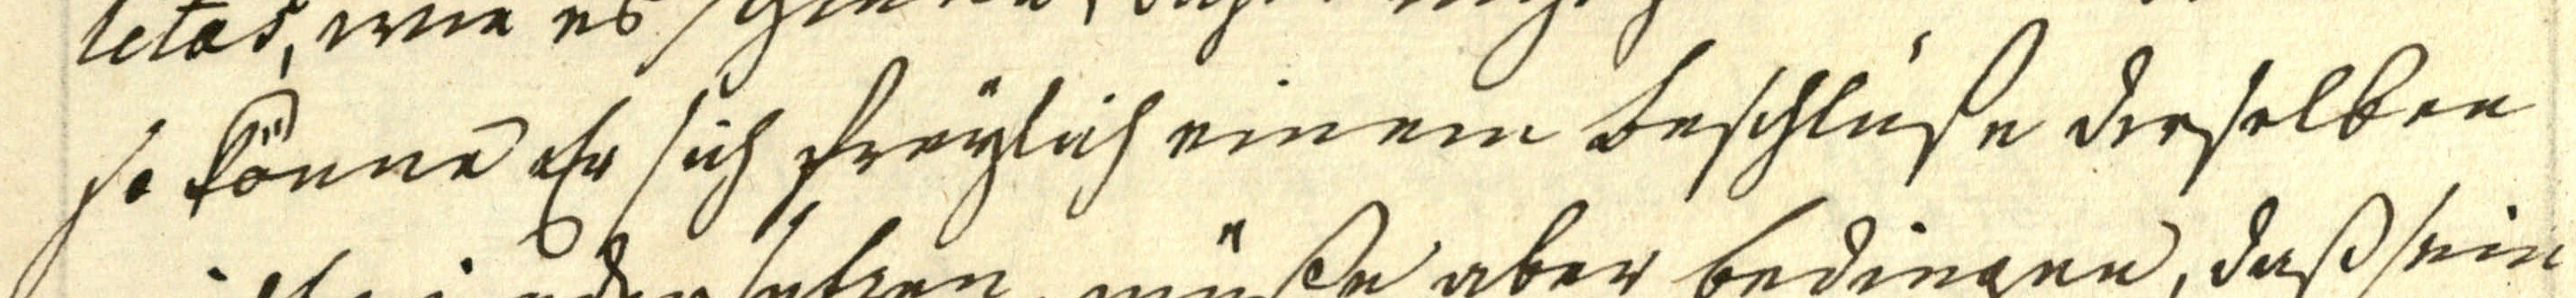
so könne Er sich freÿlich einem Beschluße derselben
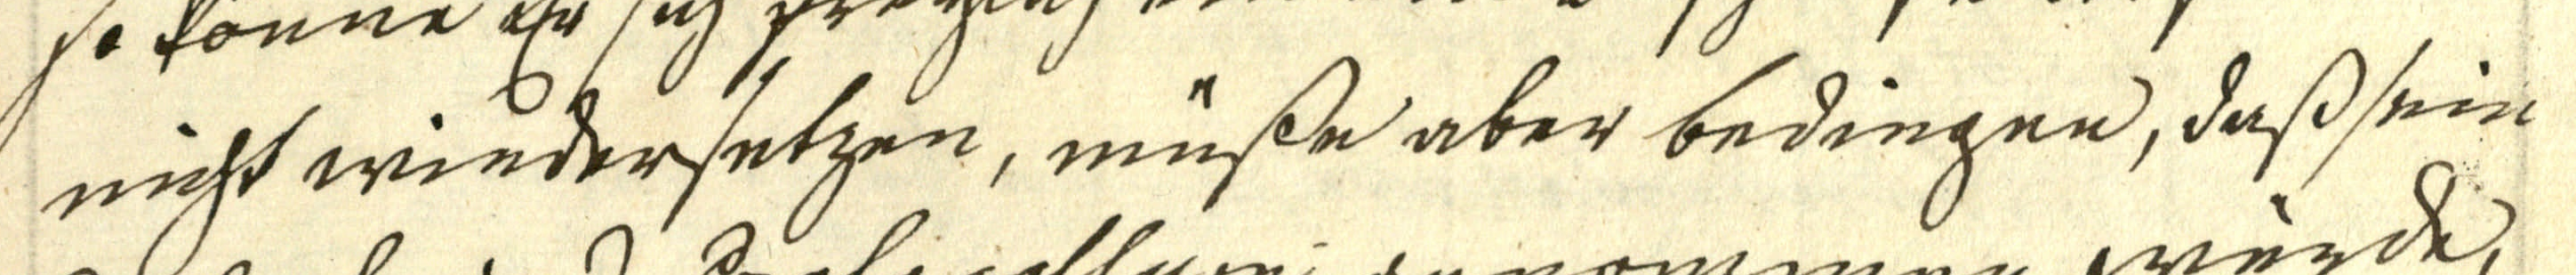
nicht wiedersetzen, müße aber bedingen, daß sein
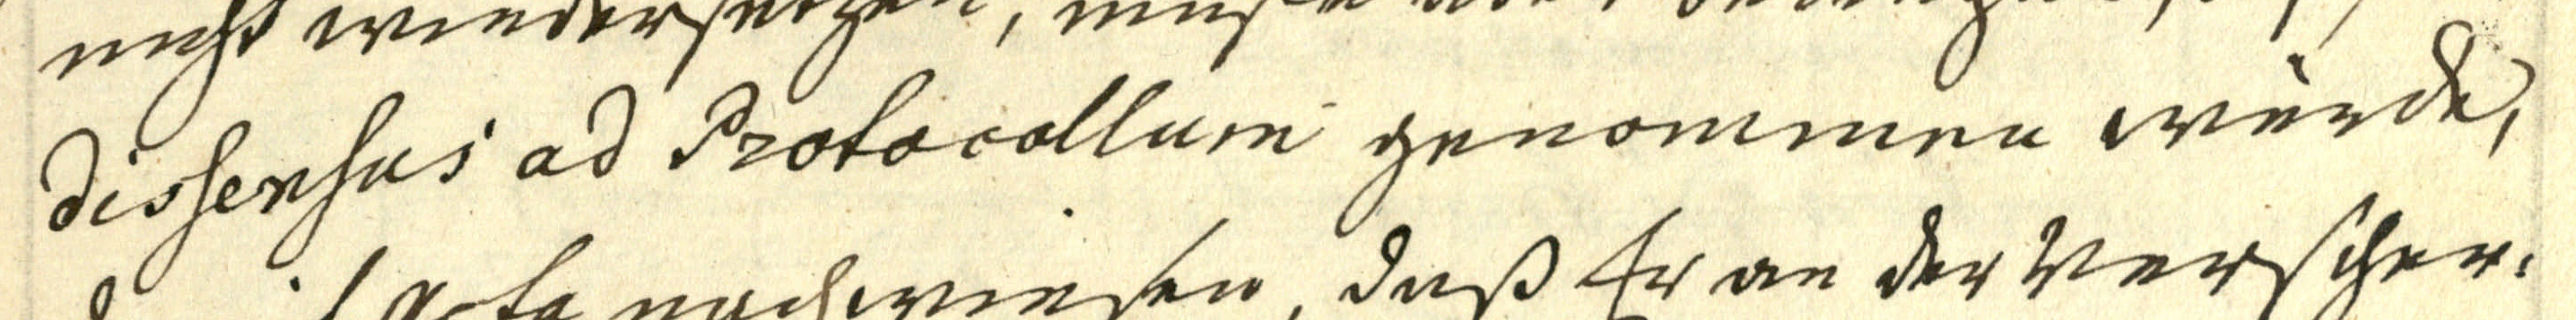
dissensus ad Protocollum genommen würde,
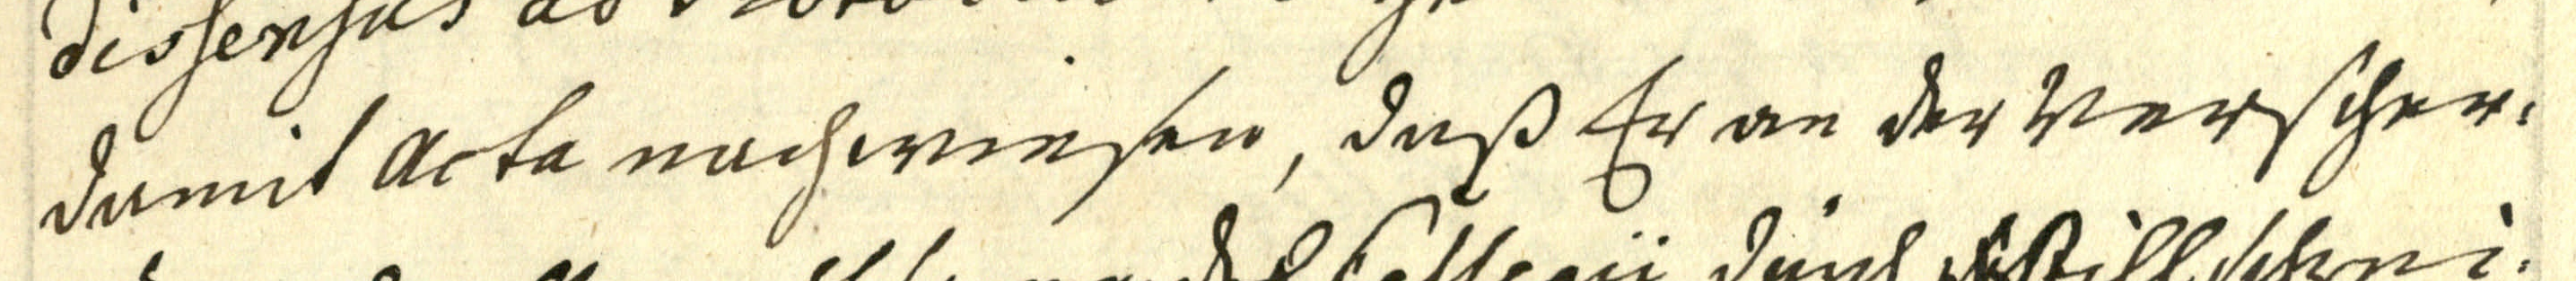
damit Acta nachwiesen, daß Er an der Verscher¬
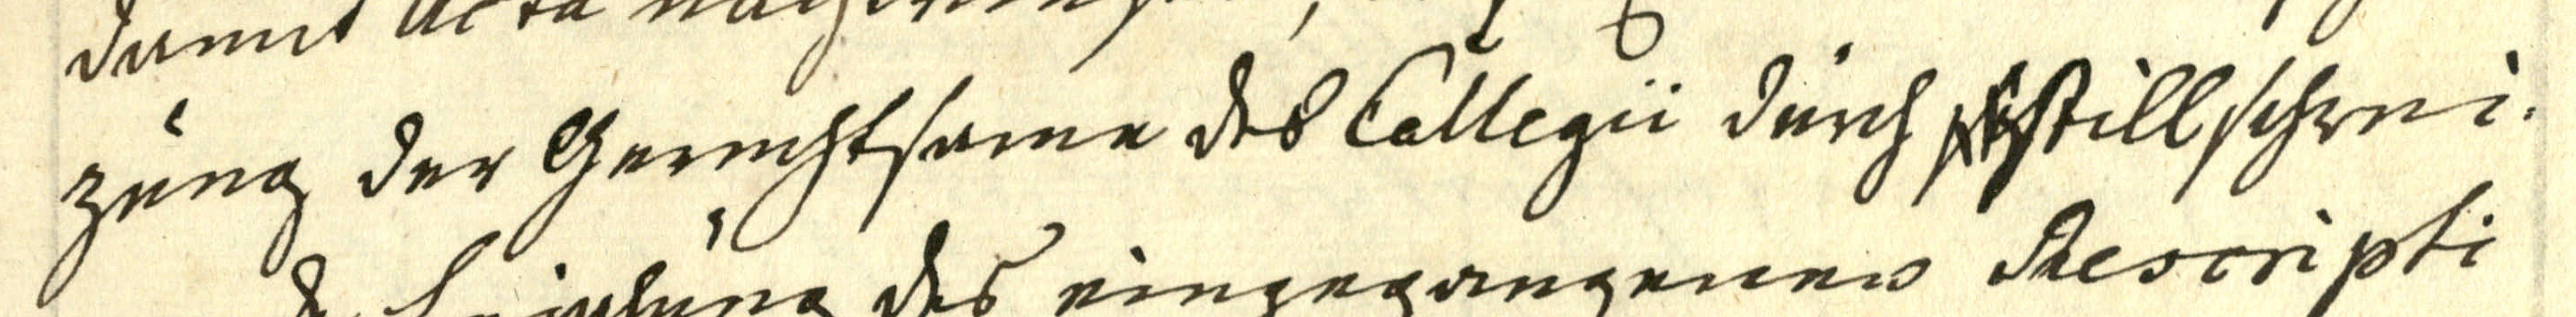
zung der Gerechtsame des Collegii durch scstillschwei¬
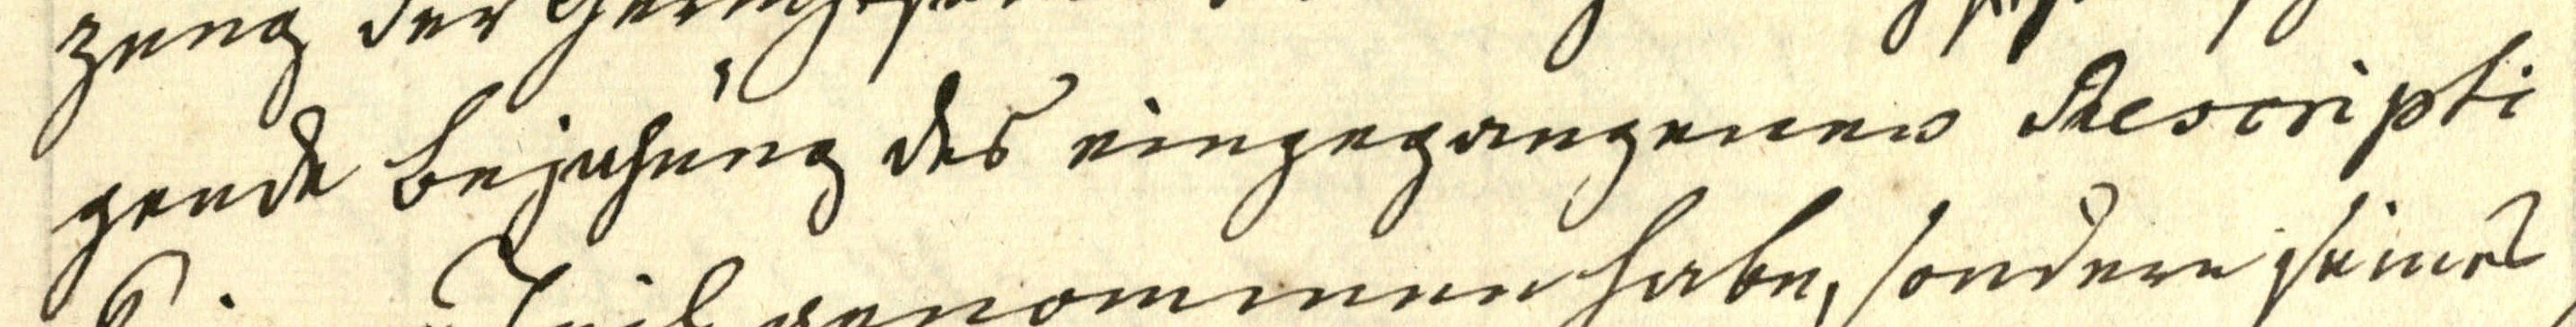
gende Bejahung des eingegangenen Rescripti
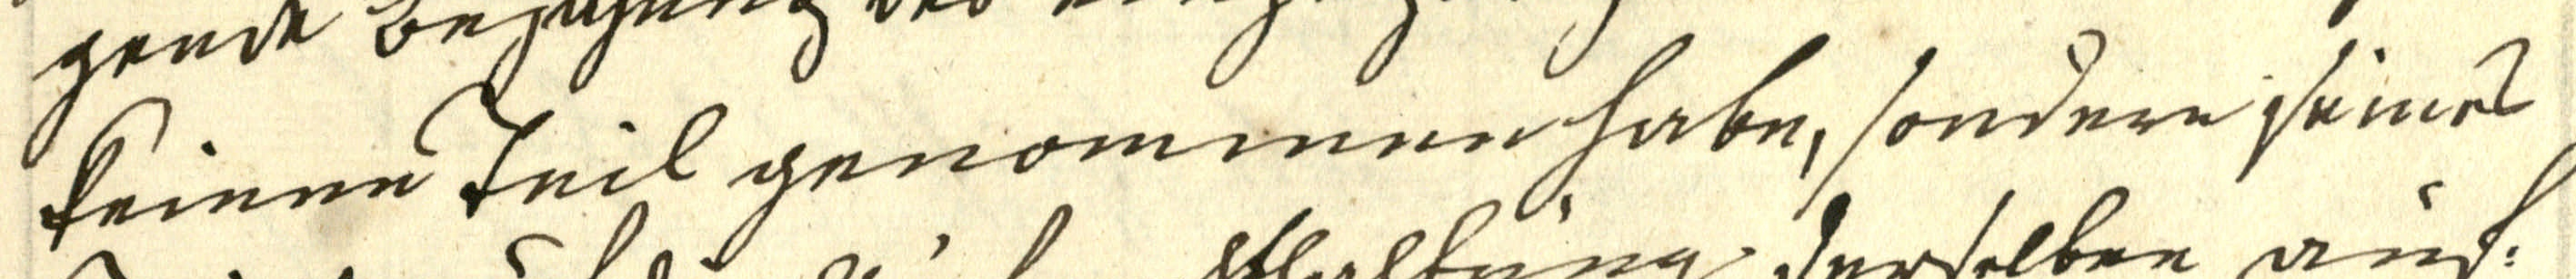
keinen Teil genommen habe, sondern seines
